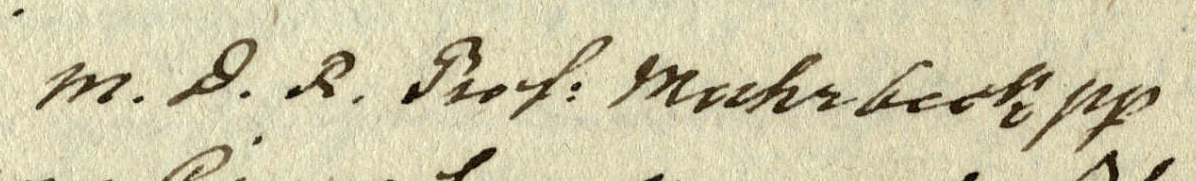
M. D. R. Prof. Muhrbeck pp
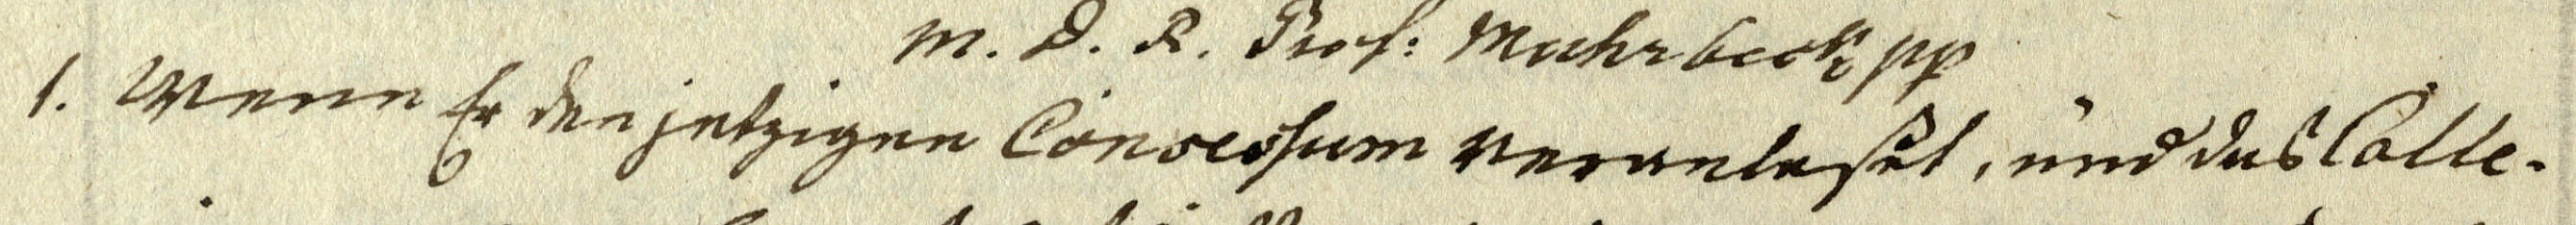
1. Wenn Er den jetzigen Consessum veranlaßet, und das Colle¬
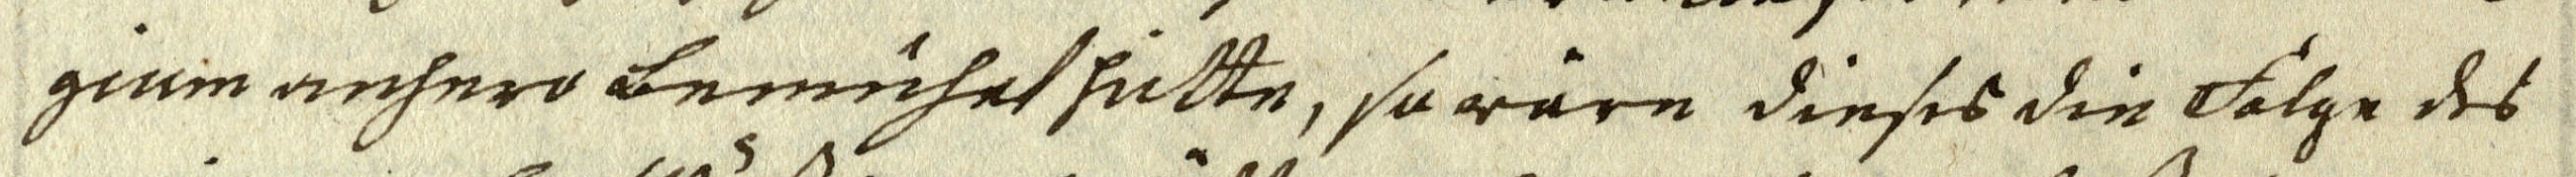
gium anhero bemühet hätte, wäre dieses die Folge des
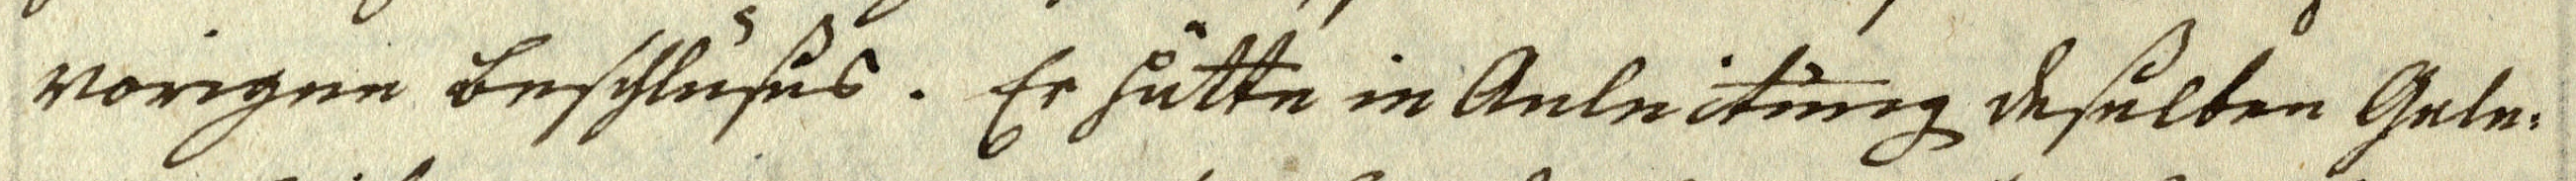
vorigen Beschlußes. Er hätte in Anleitung deßelben Gele¬
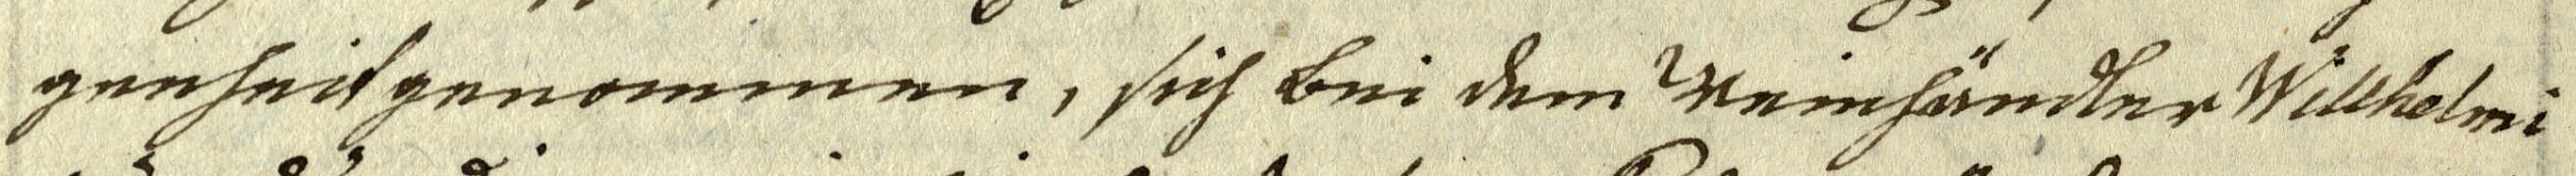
genheit genommen, sich bei dem Weinhändler Willhelmi
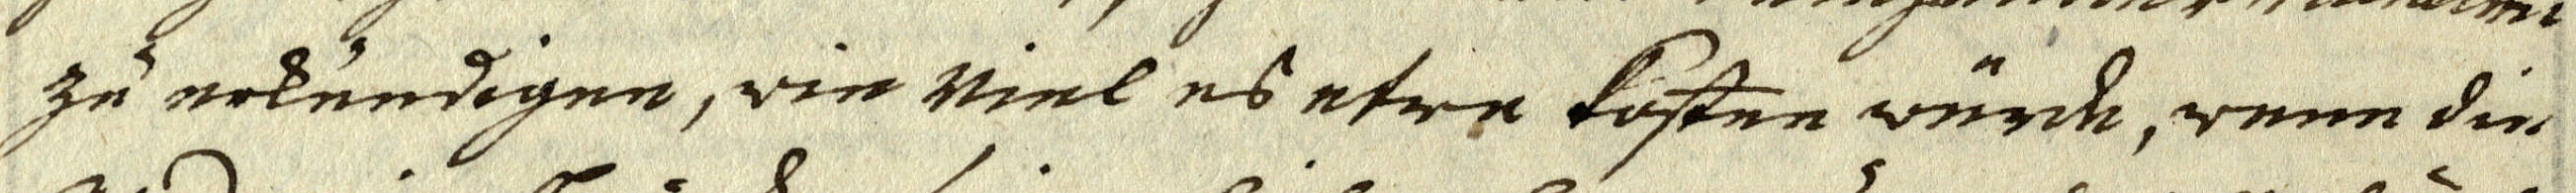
zu erkundigen, wie viel es etwa kosten würde, wenn die
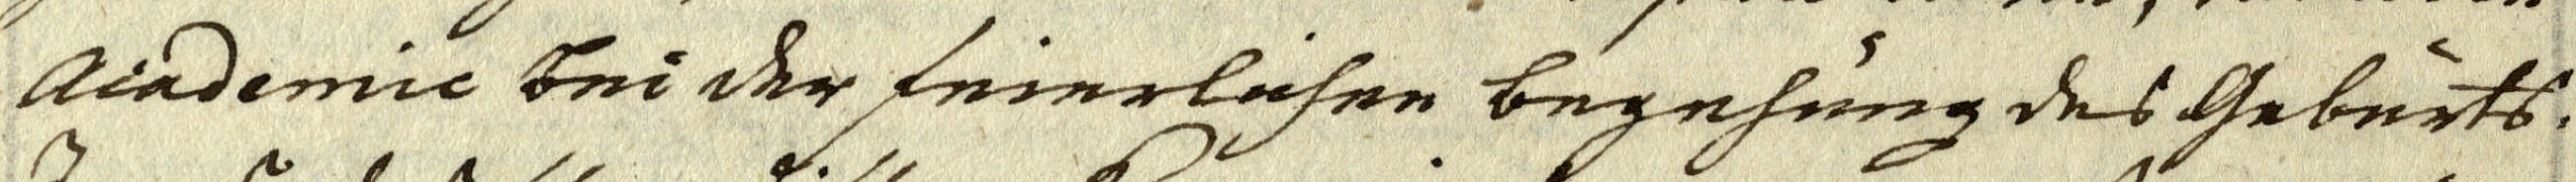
Academie bei der feierlichen Begehung des Geburts¬
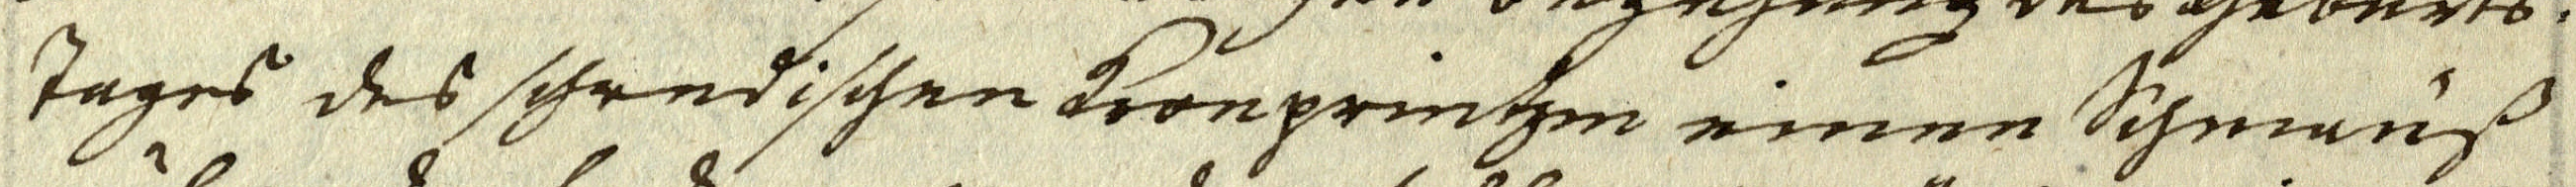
tages des schwedischen Kronprintzen einen Schmauß
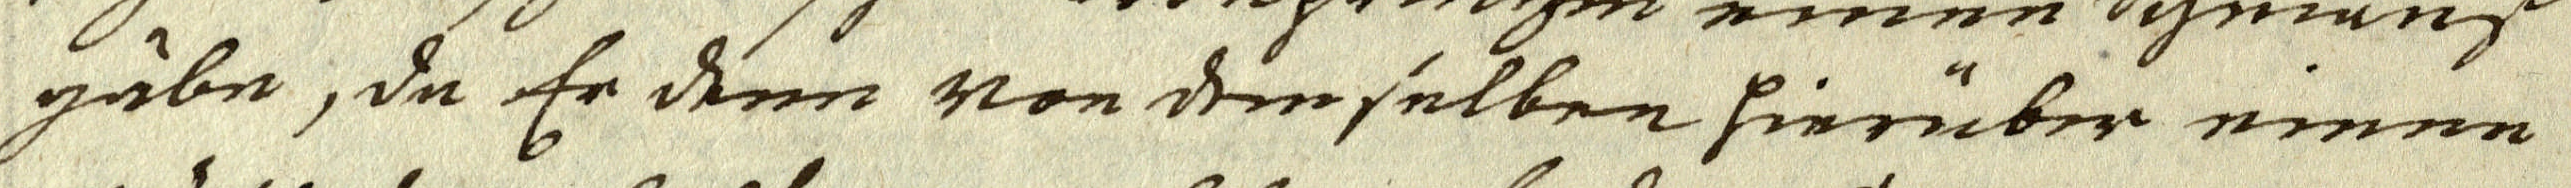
gäbe, da Er denn von demselben hierüber einen
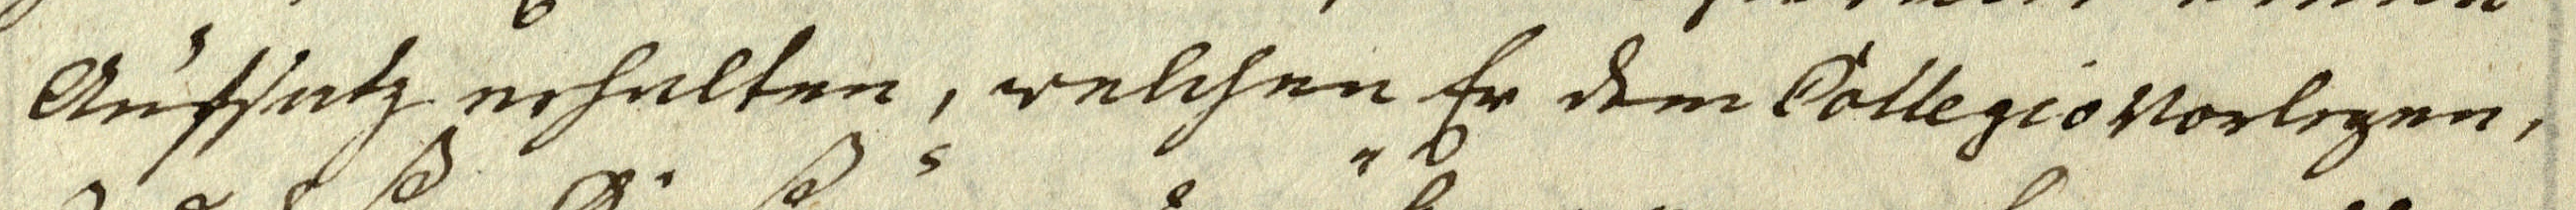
Aufsatz erhalten, welchen Er dem Collegium vorlegen,
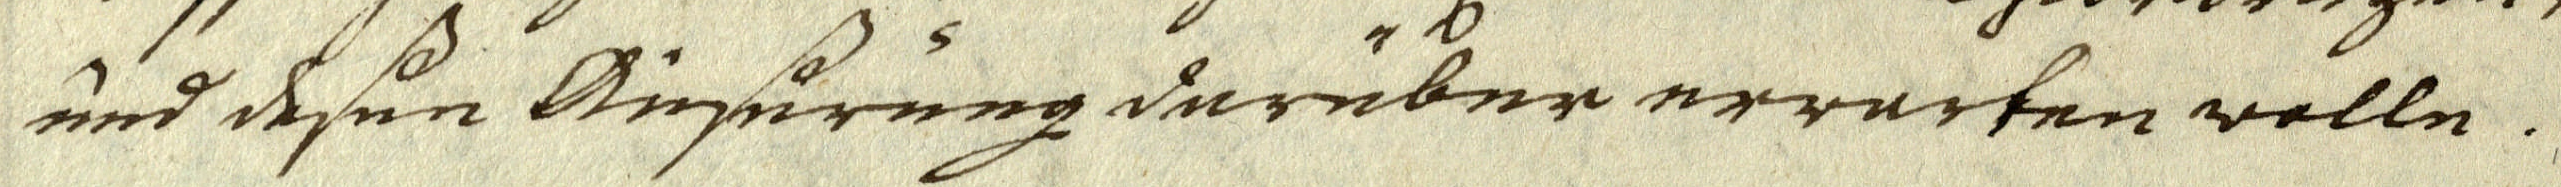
und deßen Äußerung darüber erwarten wolle.
